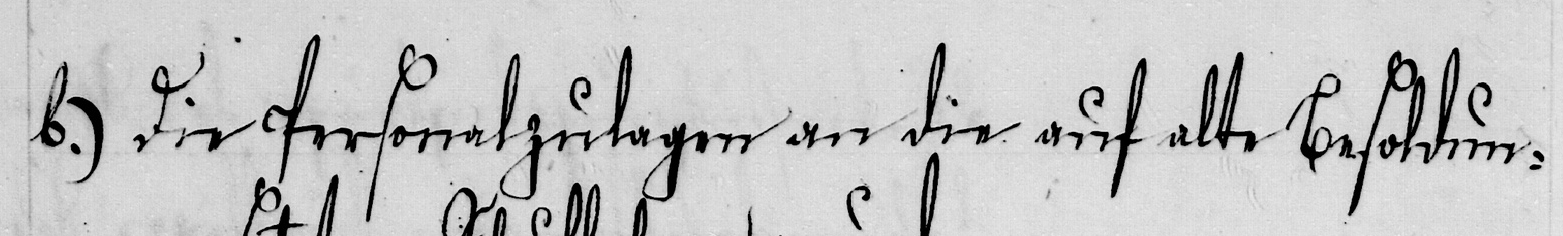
b.) Die Personenzulagen an die auf alte Besoldun¬
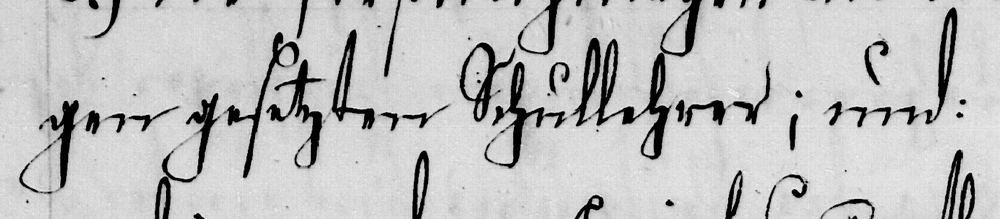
gen gesetzten Schullehrer; und:
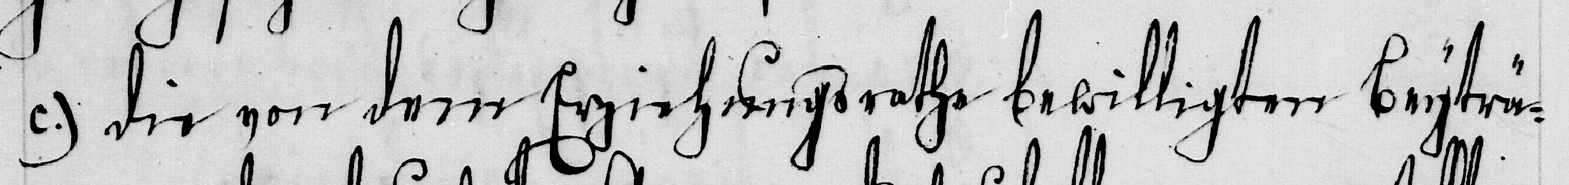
c.) die von dem Erziehungsrathe bewilligten Beyträ¬
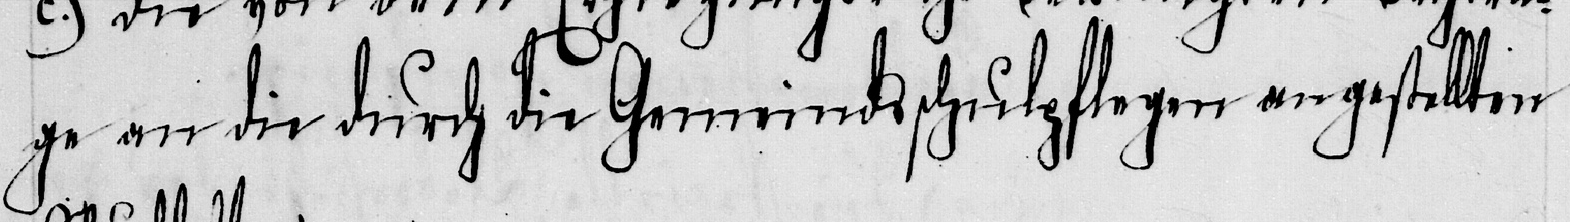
ge an die durch die Gemeindsschulpflegen angestellten
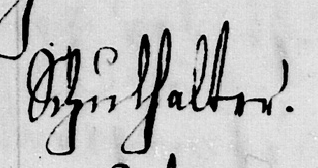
Schulhalter.
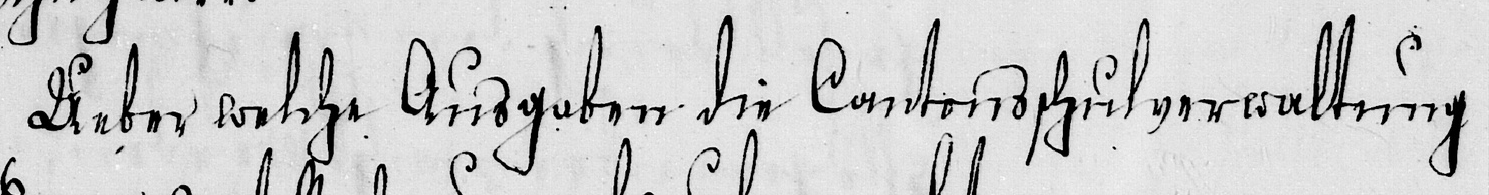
Ueber welche Ausgaben die Cantonsschulverwaltung
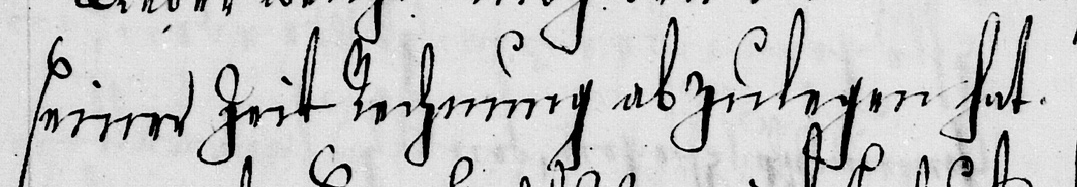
seiner Zeit Rechnung abzulegen hat.
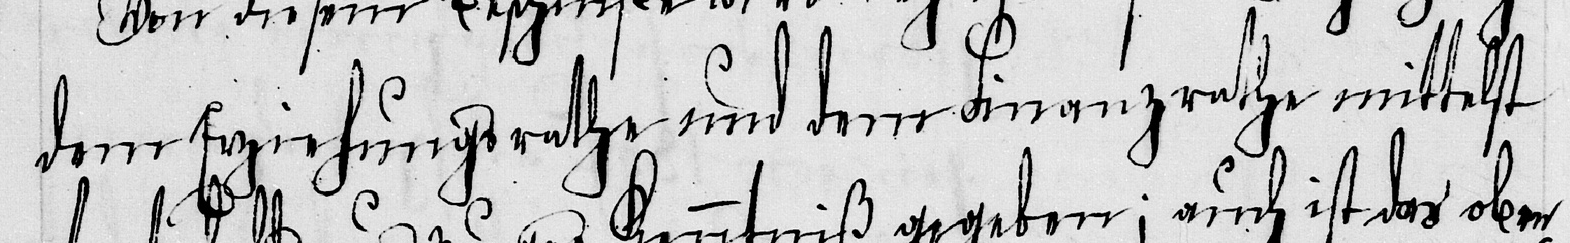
dem Erziehungsrath und dem Finanzrathe mittelst
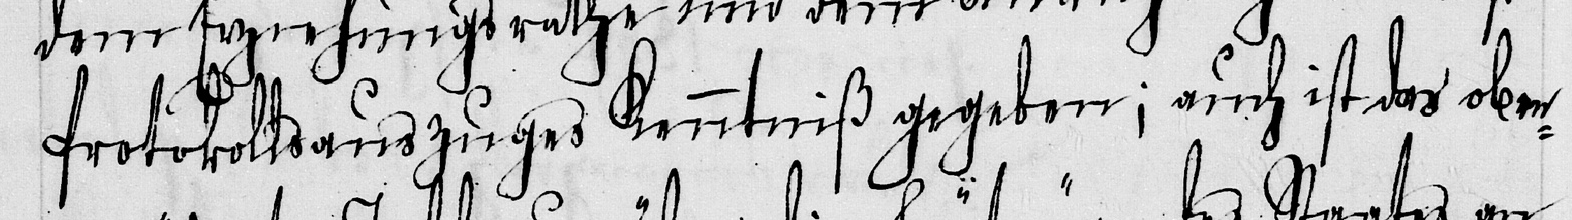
Protokollsauszuges Kenntniß gegeben; auch ist das obe¬
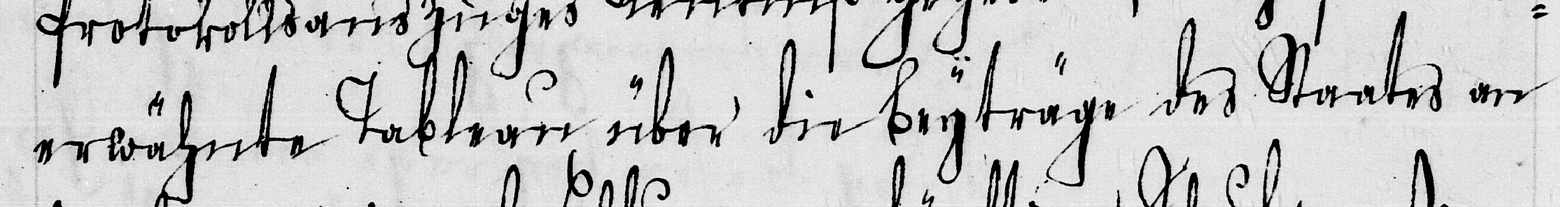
nerwähnte Tableau über die Beyträge des Staates an
